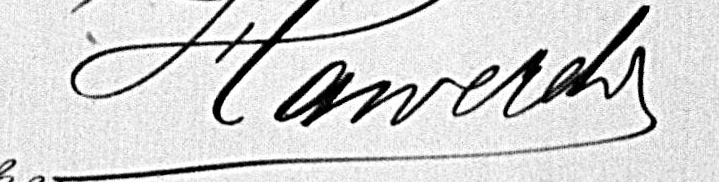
Hawerxx
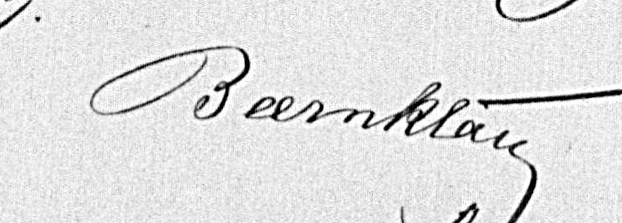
Bxx
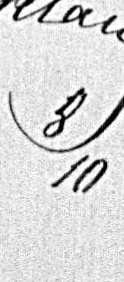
8/10
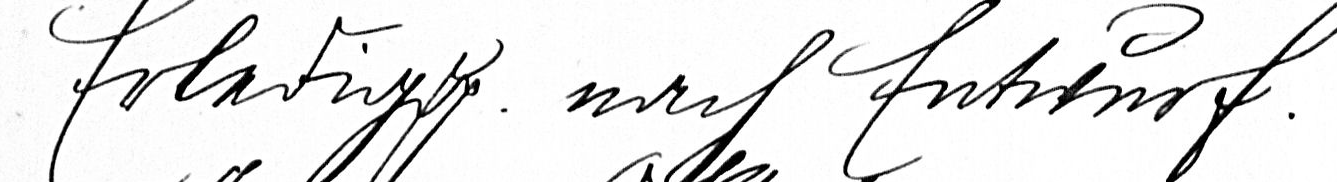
Erledigg. nach Entwurf.
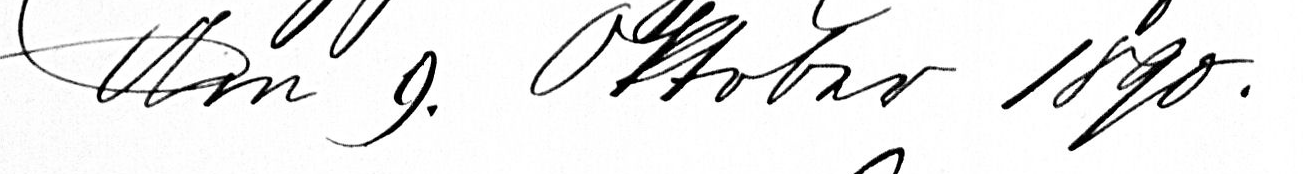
Am 9. Oktober 1890.
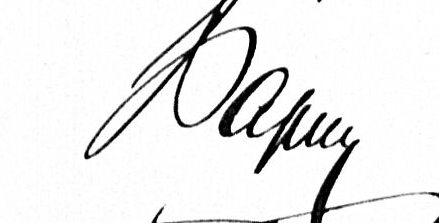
xx
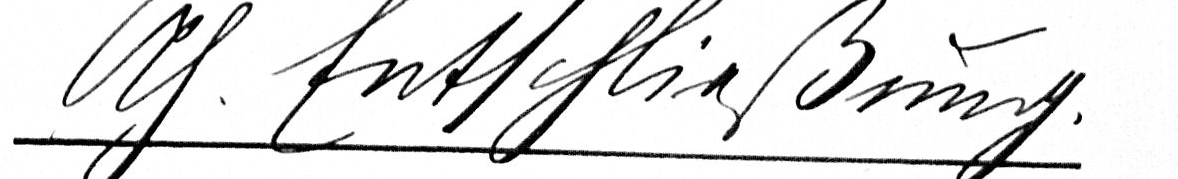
Ah. Entschließung.
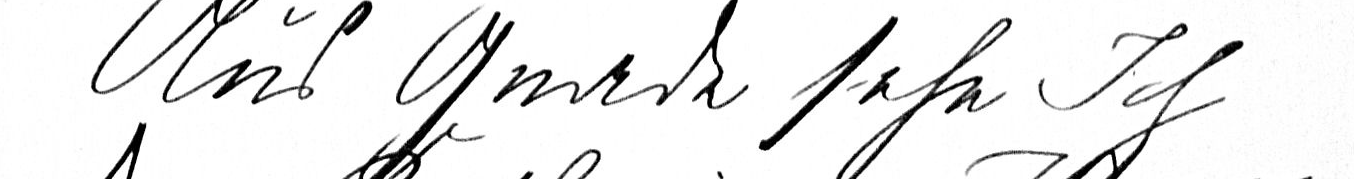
Aus Gnade sehe Ich
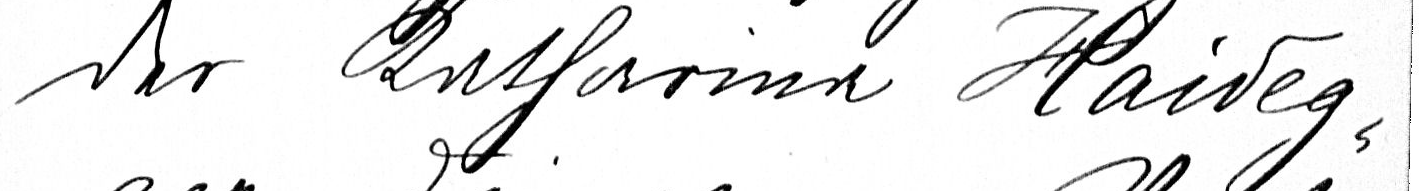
der Katharina Haideg¬
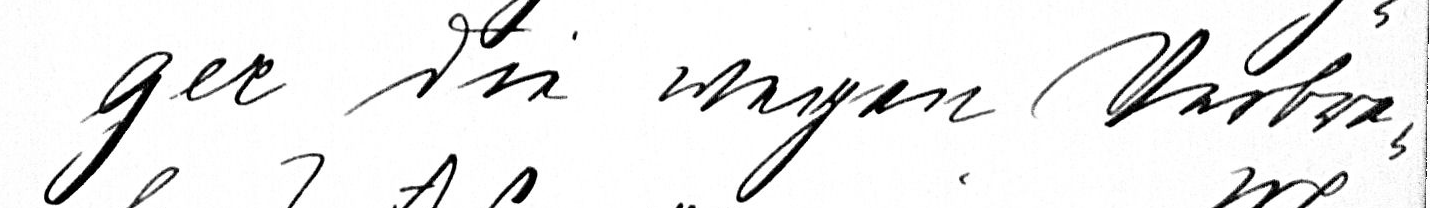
ger die wegen Verbre¬
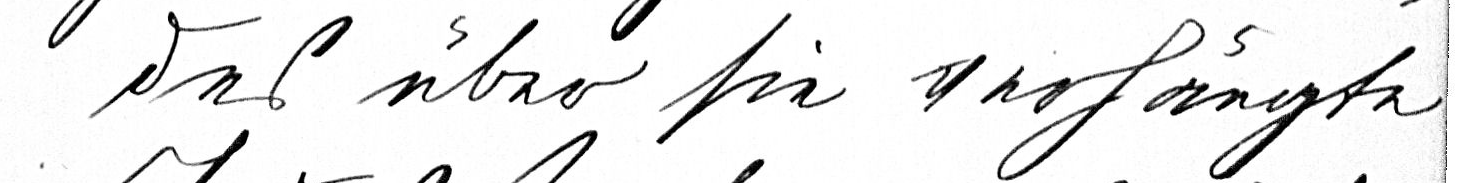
des über sie verhängte
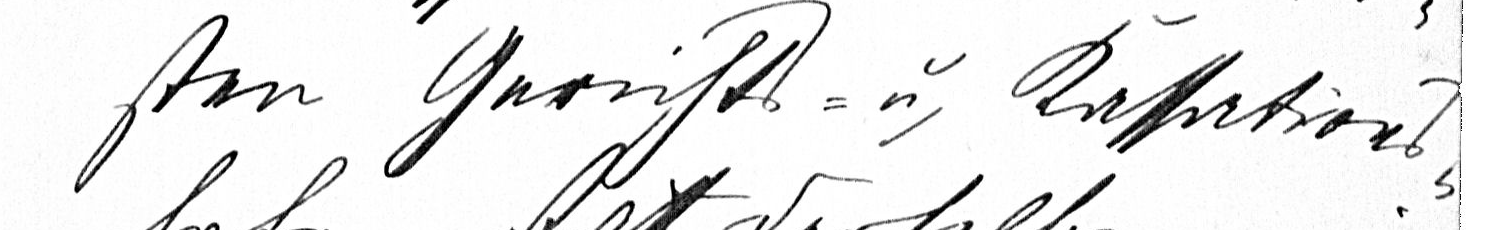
sten Gerichts- u, Kassations¬
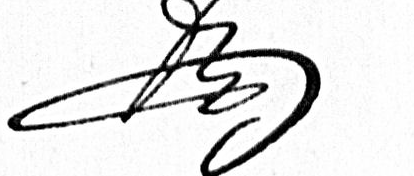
xx
